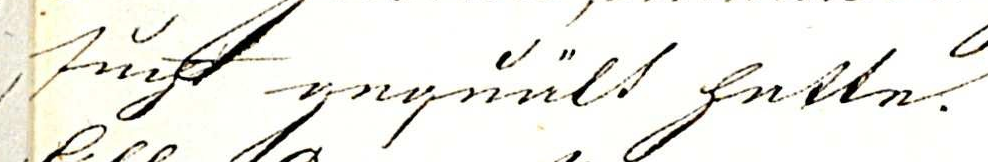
sucht gequält halte.
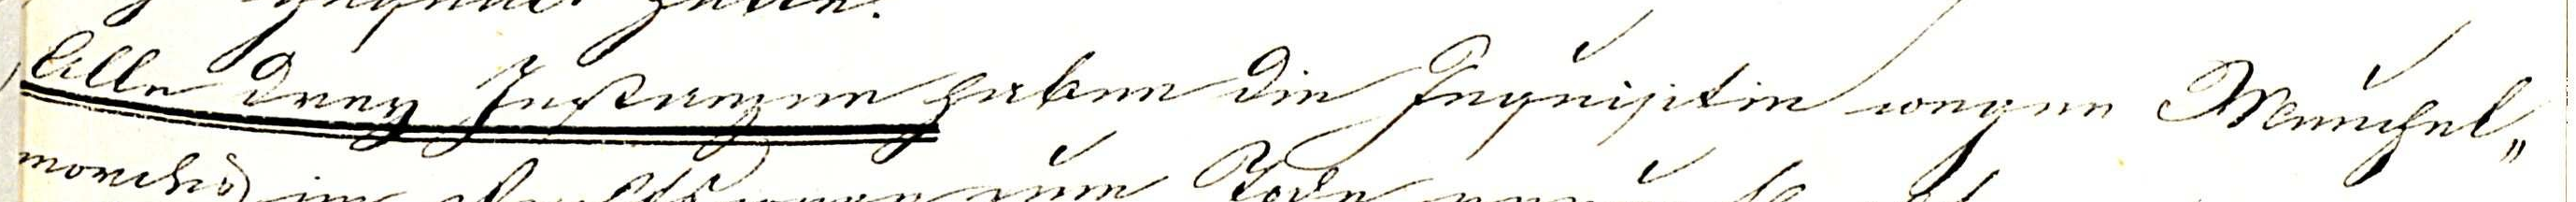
Alle drey Jnstanzen haben die Jnquisitin wegen Munchel¬
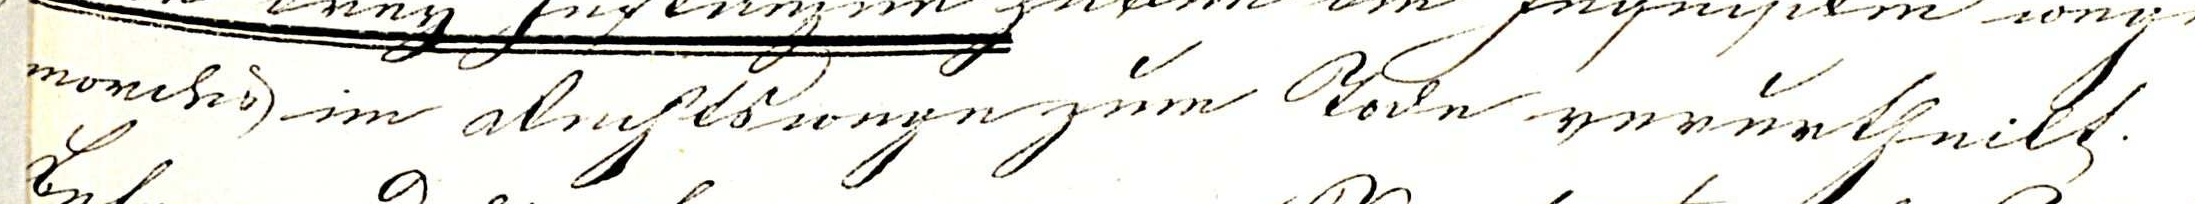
mordes im Rechtswege zum Tode verurtheilt.
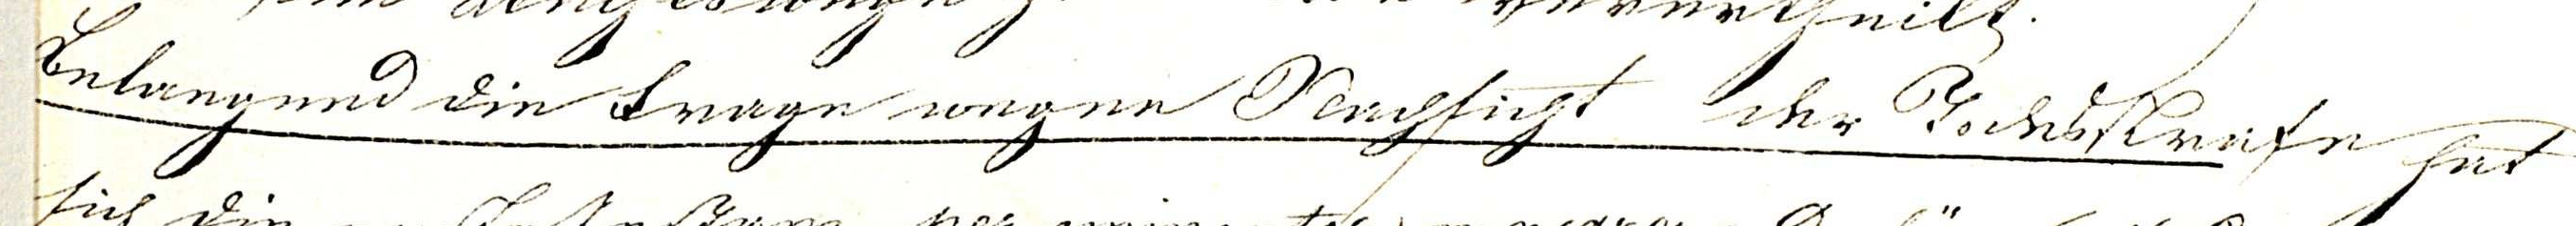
Belangend die Frage wegen Nachsicht der Todesstrafe hat
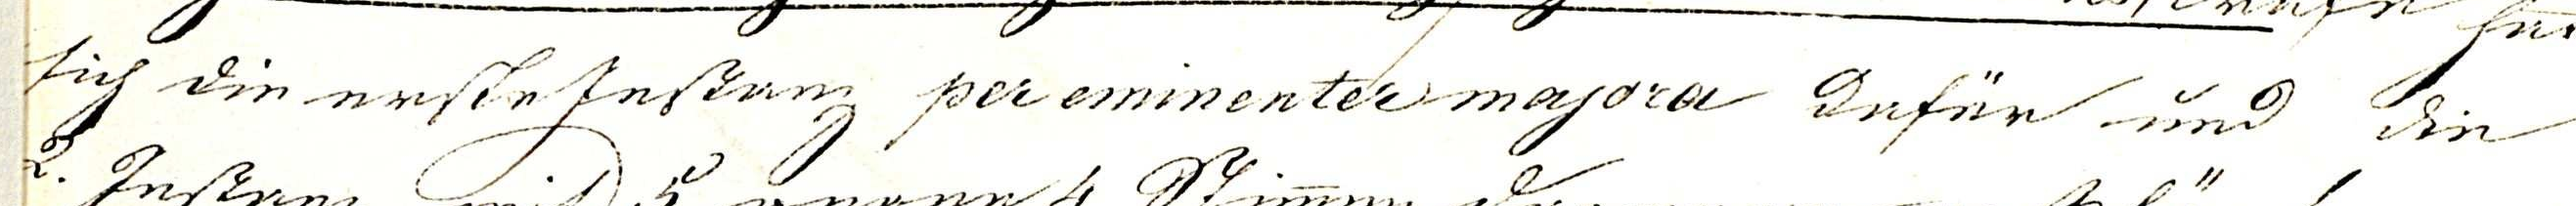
sich die erste Jnstanz per eminenter majora dafür und die
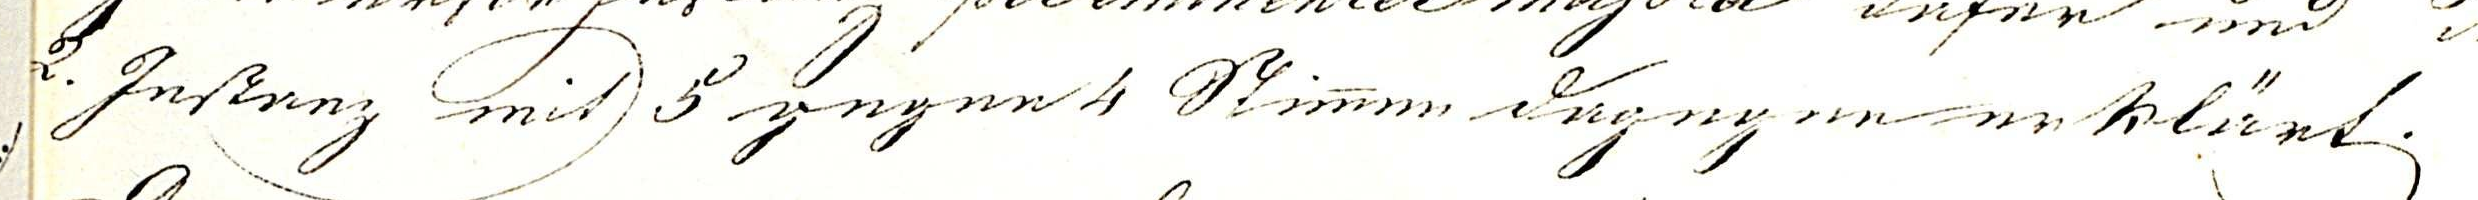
2. Jnstanz mit 5 gegen 4 Stimmen dagegen er klärt.
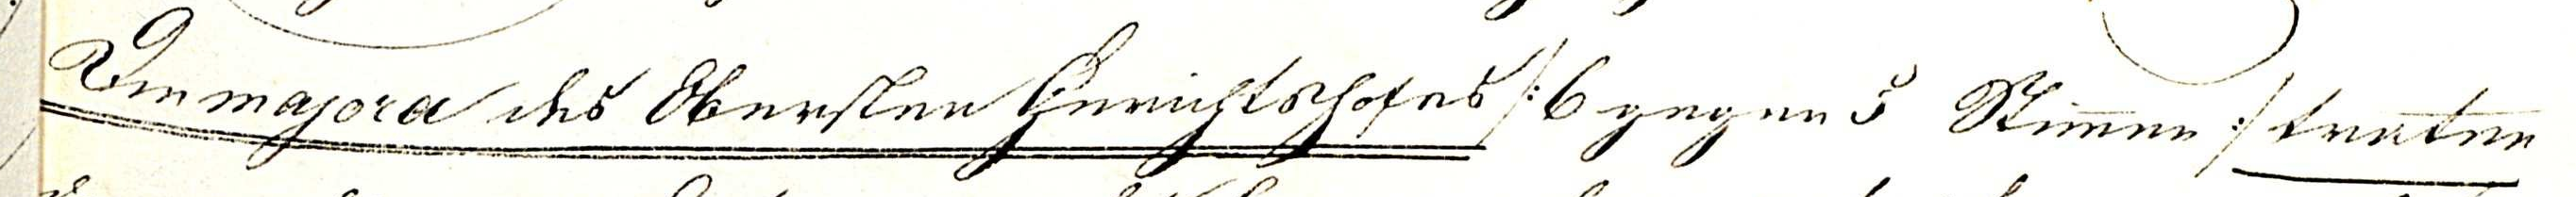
Die majora des Obersten Gerichtshofes /: 6 gegen 5 Stimmen :/ traten
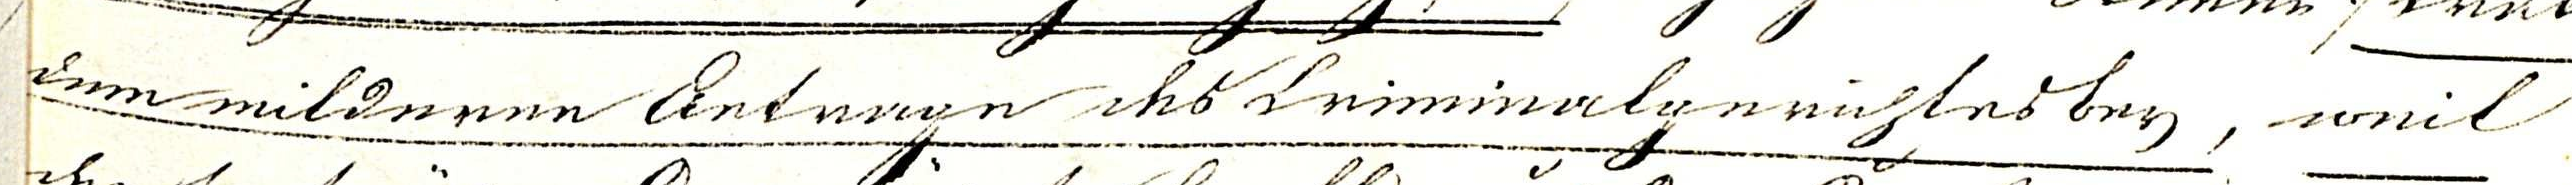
dem milderen Antrage des Criminalgerichtester, weil
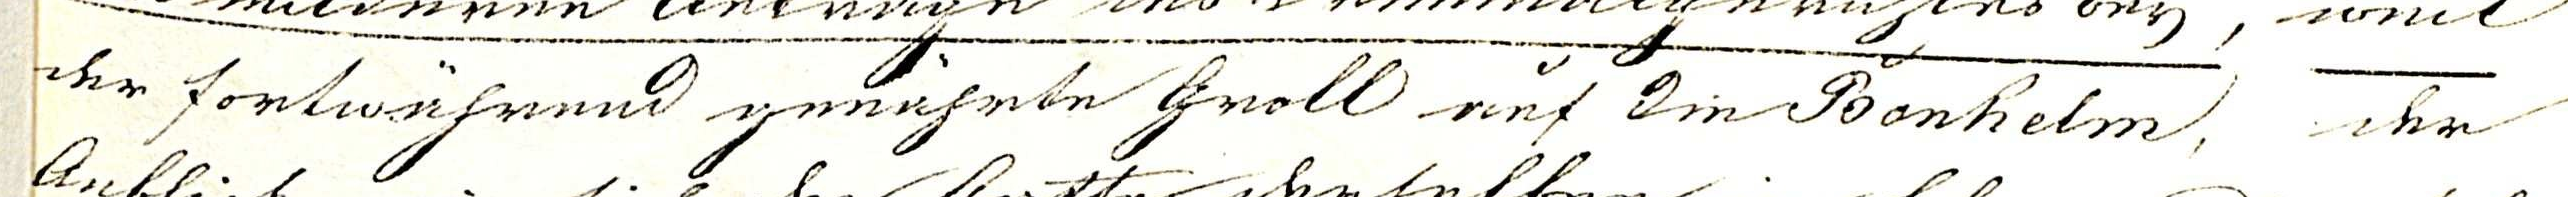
der fortwährend genährte Groll auf die Bonhelm, der
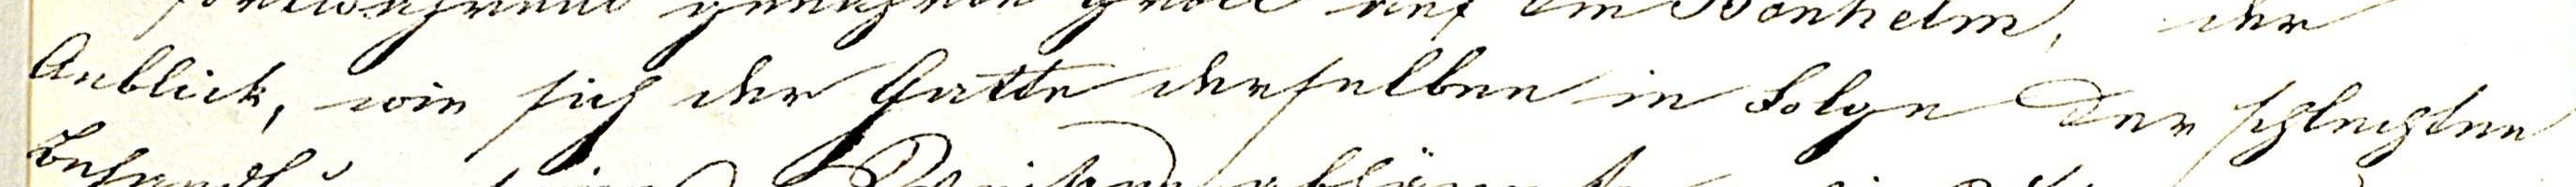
Anblick, wie sich der Gatte derselben in Folge der schlechten
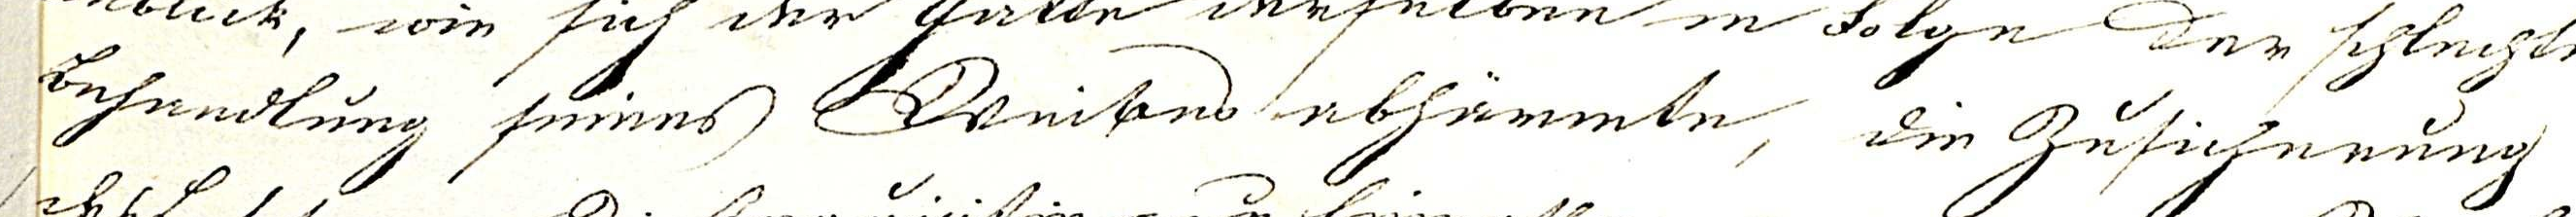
Behandlung seines Weibes abhärmte, die Zusicherung
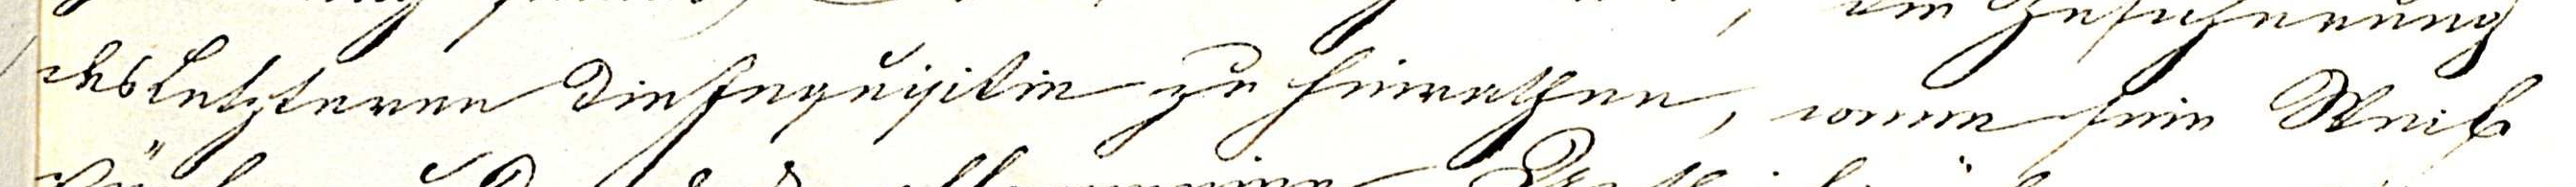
des Letzteren die Jnquisitin zu hinrathen, wenn sein Weib
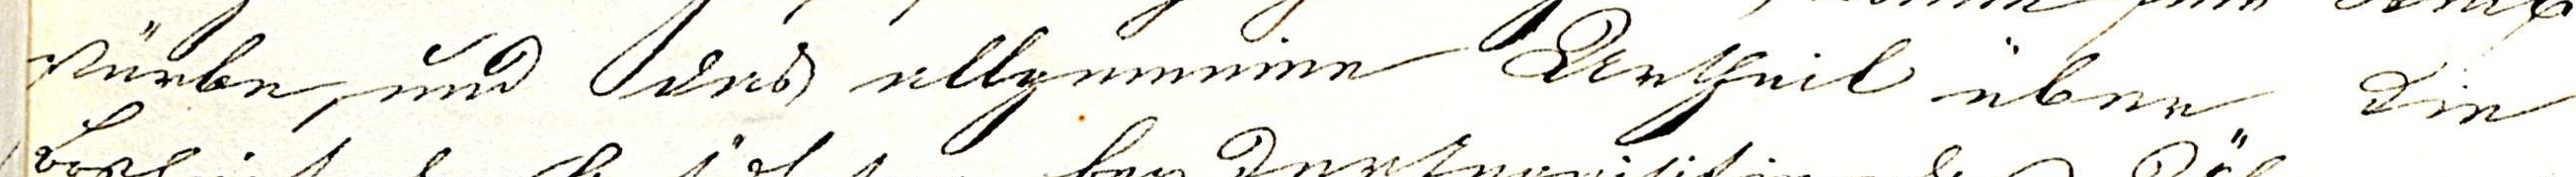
stürbe, und des allgemeine Urtheil über die
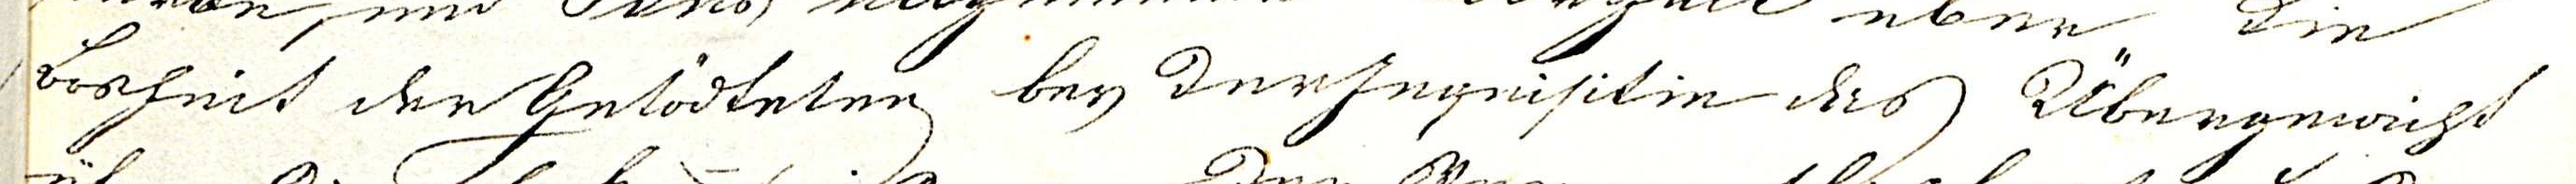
Bosheit der Getödteten bey der Jnquisitin das Übergewicht
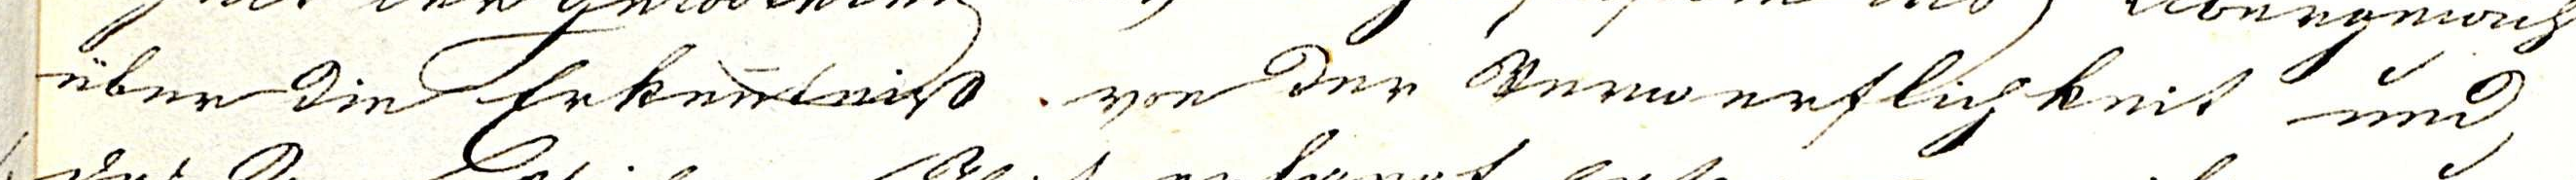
über die Erkenntniß von der Verwerflichkeit und
